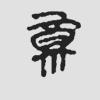福
